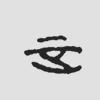正
